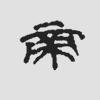帝
